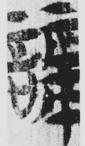諦
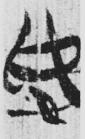○（恕）
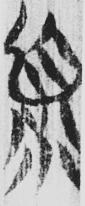○（寡）
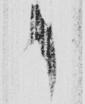人
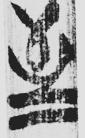至
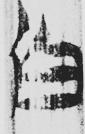於
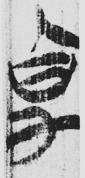○（使）
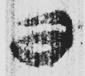日
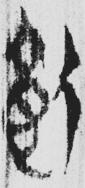○（食）
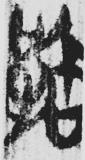○（鮑）
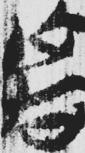○（叔）
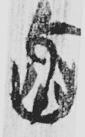○（牙）
